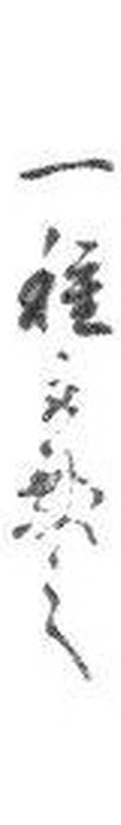一種被献之
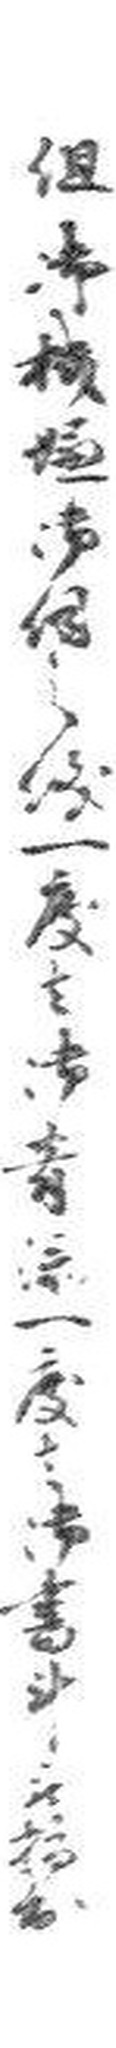但御機嫌御伺之儀一度者御肴添一度者御書斗被指出
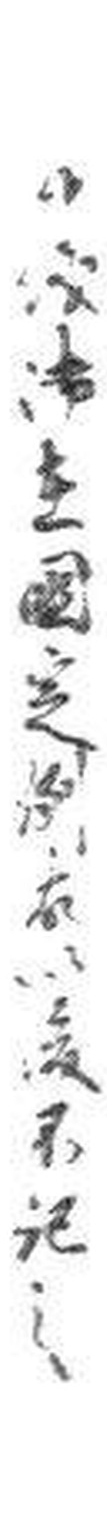候儀御在国定例故以後不記之
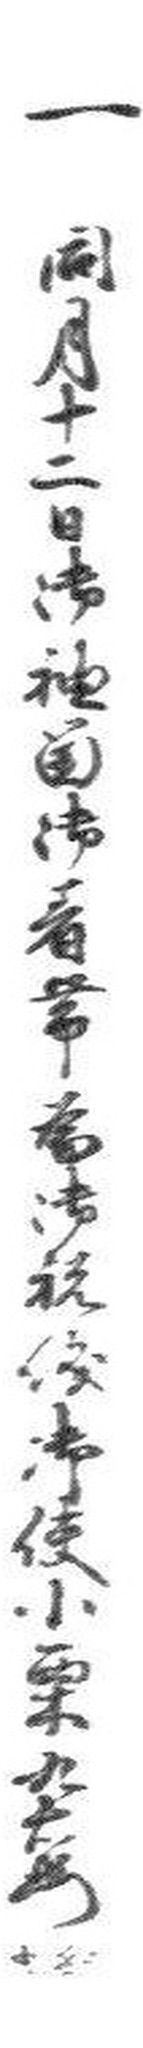一同月十二日御袖留御着帯為御祝儀御使小栗九右衛門
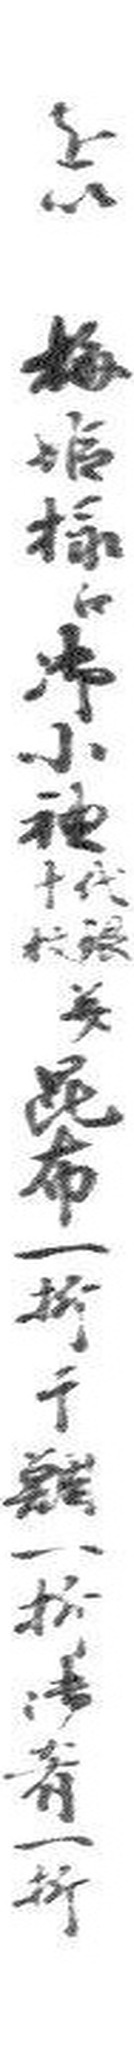を以梅姫様江御小袖代銀十枚并昆布一折干鯛一折御肴一折
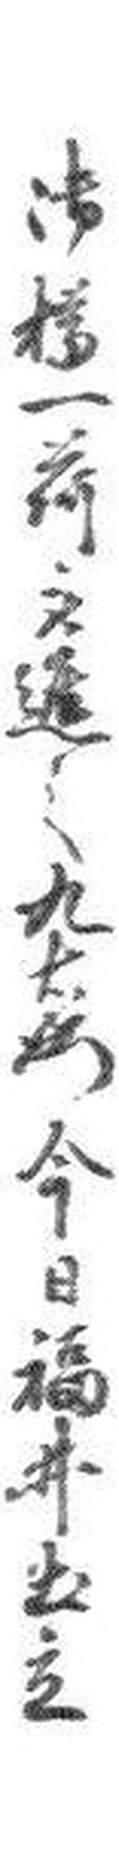御樽一荷被進之九右衛門今日福井出立
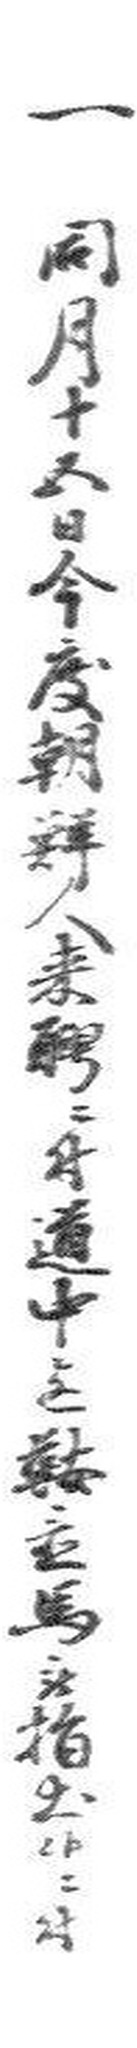一同月十五日今度朝鮮人来聘ニ付道中迄鞍置馬被指出候ニ付
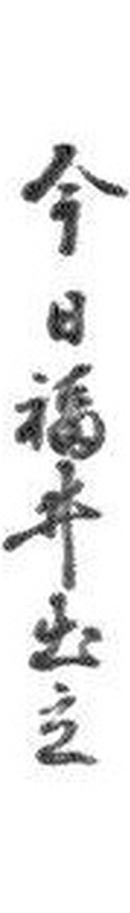今日福井出立
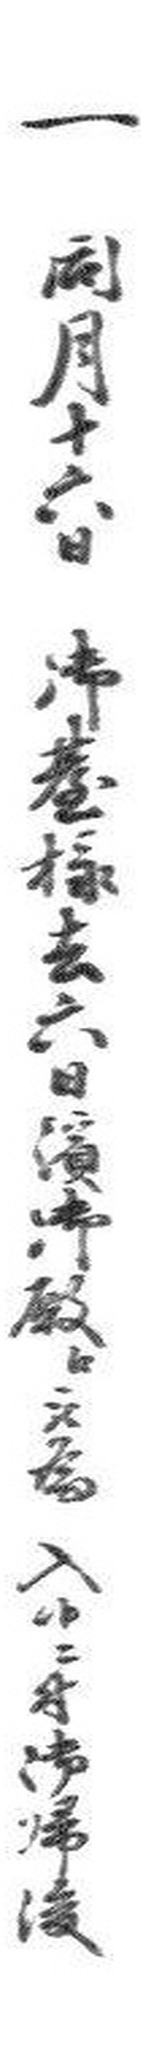一同月十六日御台様去六日浜御殿江被為入候ニ付御帰後

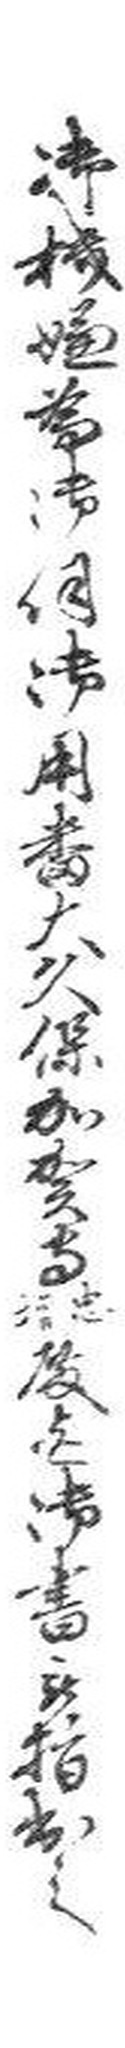御機嫌為御伺御用番大久保加賀守忠増殿迄御書被指出之
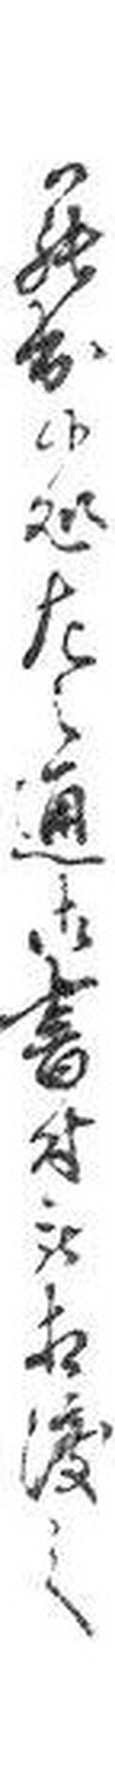罷出候処左之通御書付被相渡之
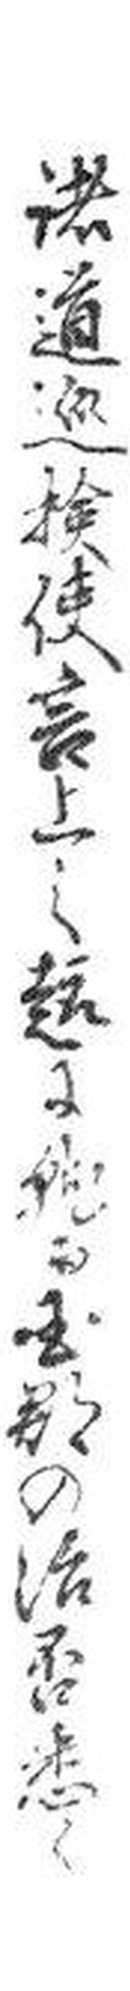諸道巡検使言上之趣に就而国郡の治否悉く
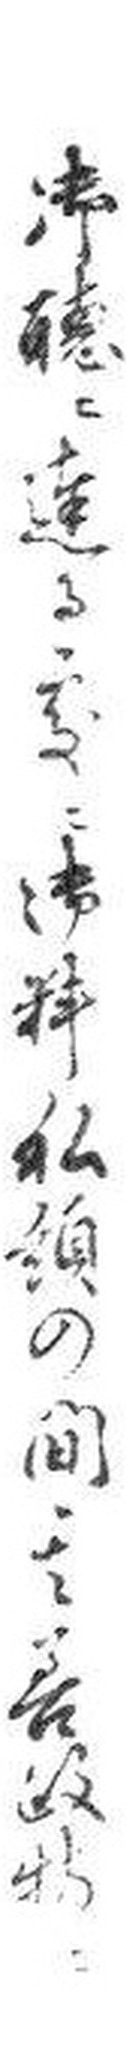御聴ニ達る処ニ御料私領之間其善政特ニ
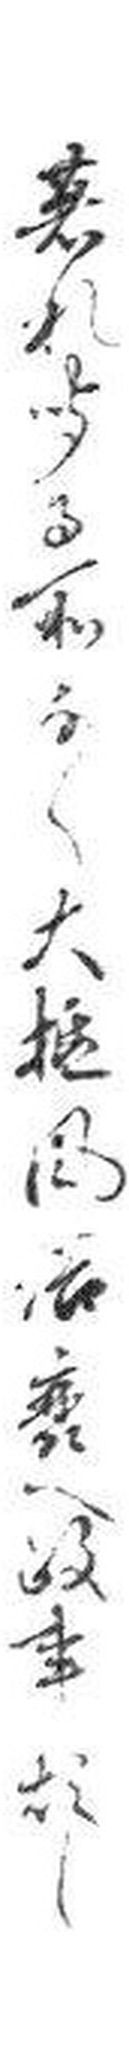著れ聞る所なく大抵風俗衰へ政事煩し
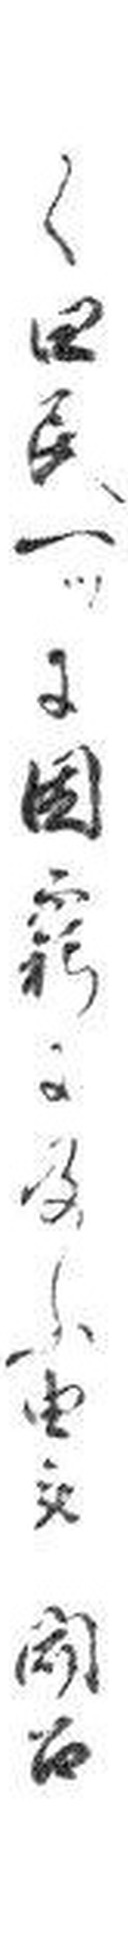く四民一ツに困窮に及ふ由被聞召
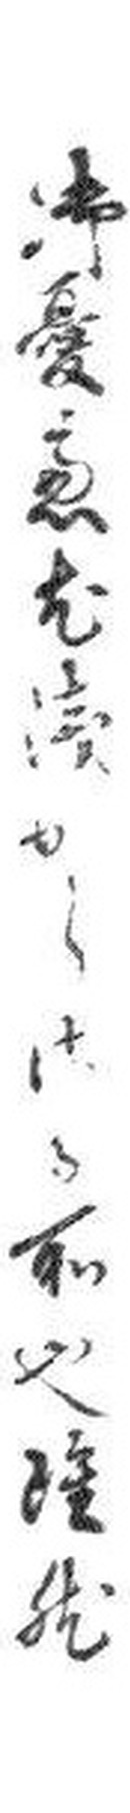御憂慮尤浅からさる所也雖然
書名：家譜 二十八 吉邦公 従宝永七年七月五日到正徳元年十二月
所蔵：福井県文書館 Fukui Prefectural Archives
